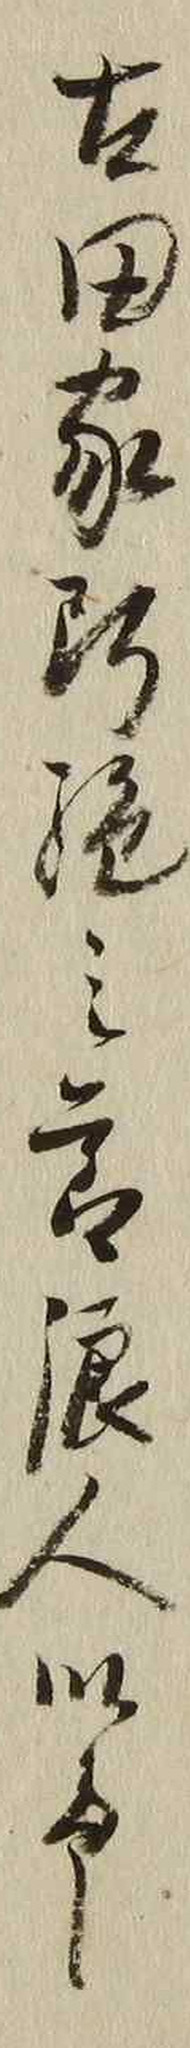古田家断絶之節浪人いたし
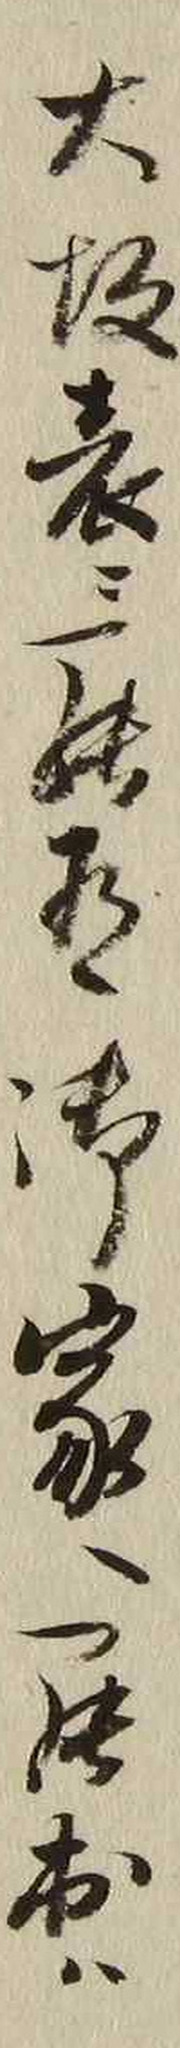大坂表ニ罷有御家へ罷出ハ
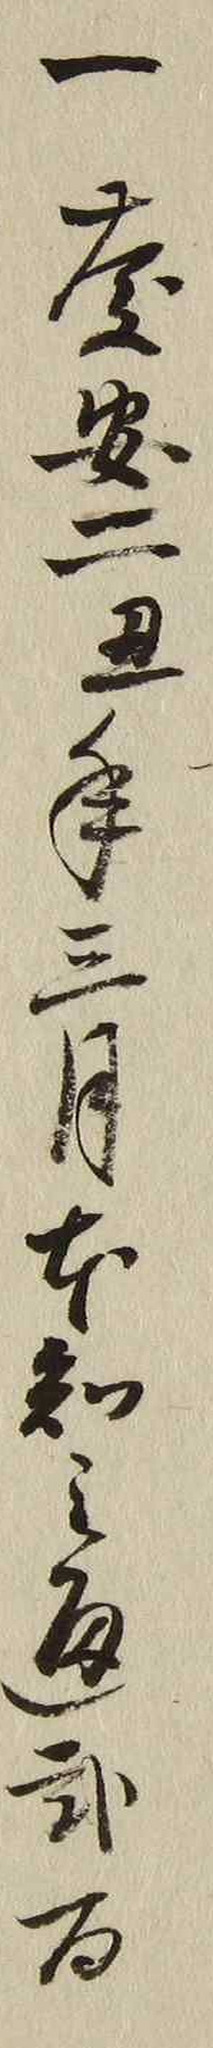一慶安二丑年三月本知之通弐百
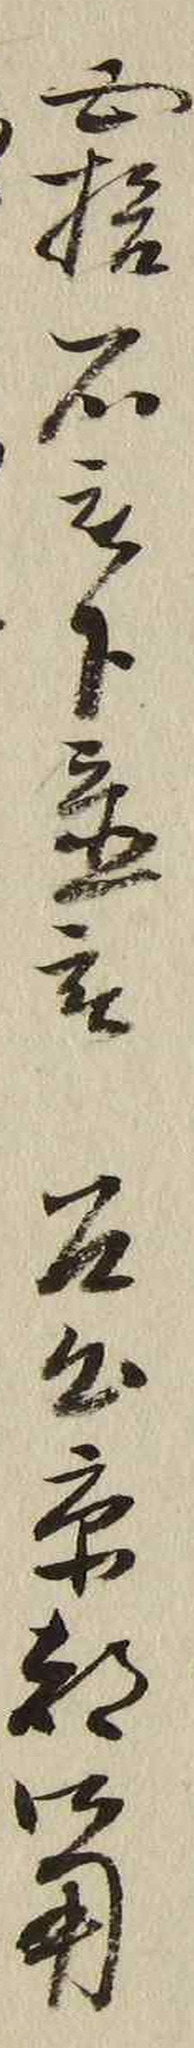五拾石被下置被召出京都御用
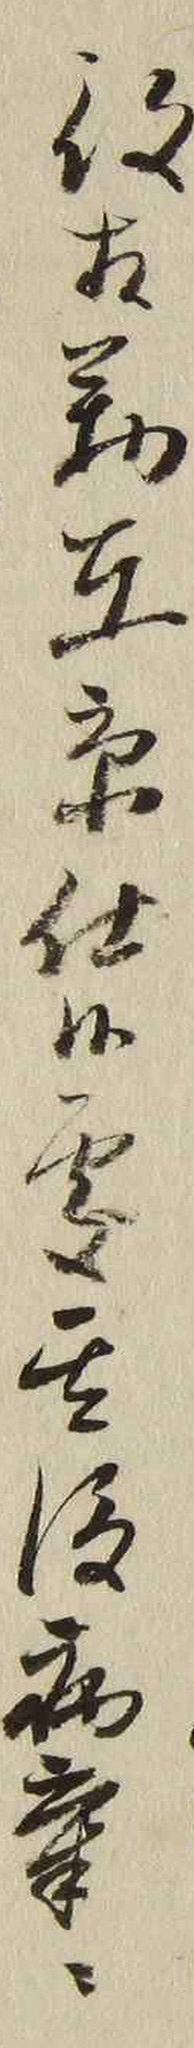役相勤在京仕候処其後病気ニ
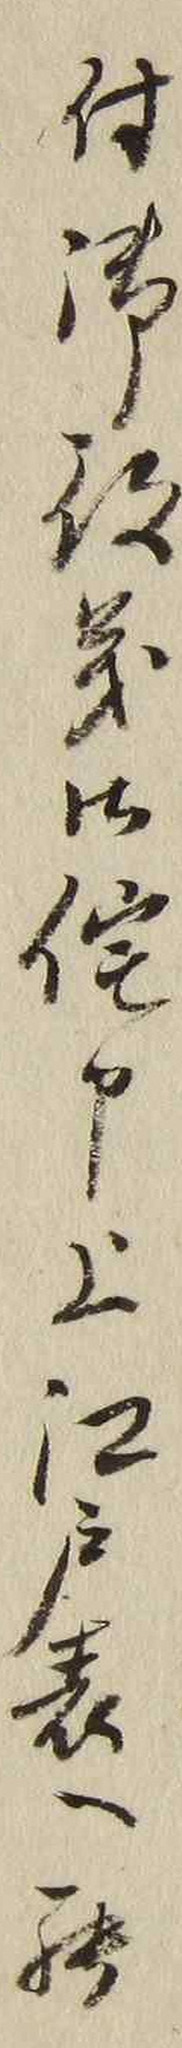付御役義御侘申上江戸表へ罷

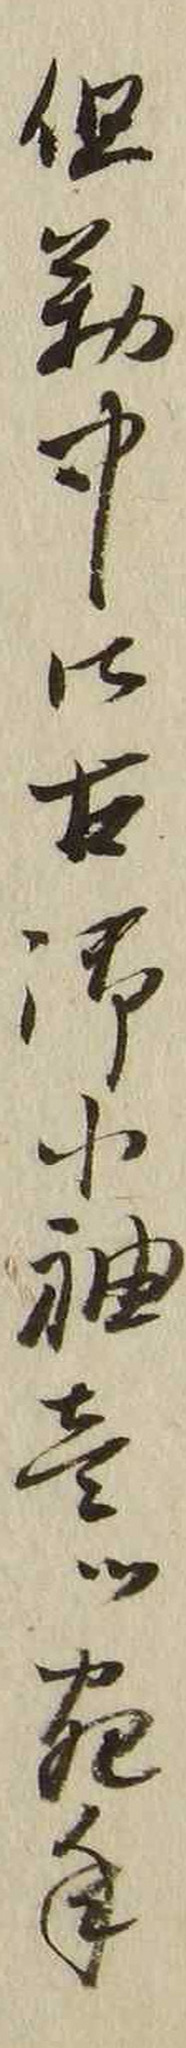但勤中御古御小袖壱ツ宛年
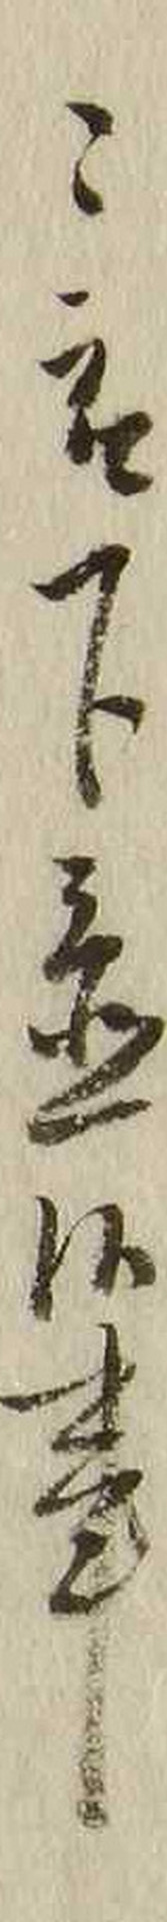々被下置候事
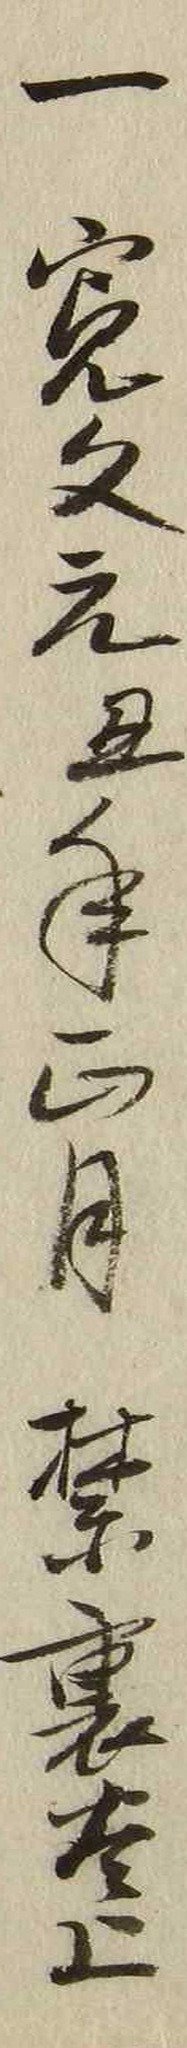一寛文元丑年正月禁裏炎上
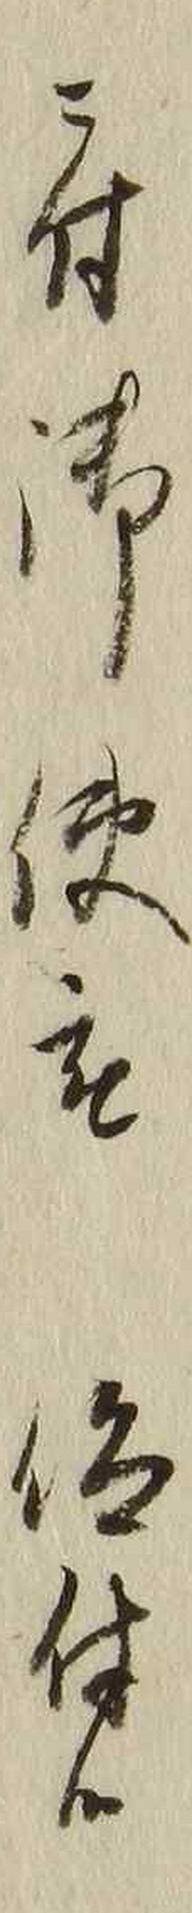ニ付御使被仰付候
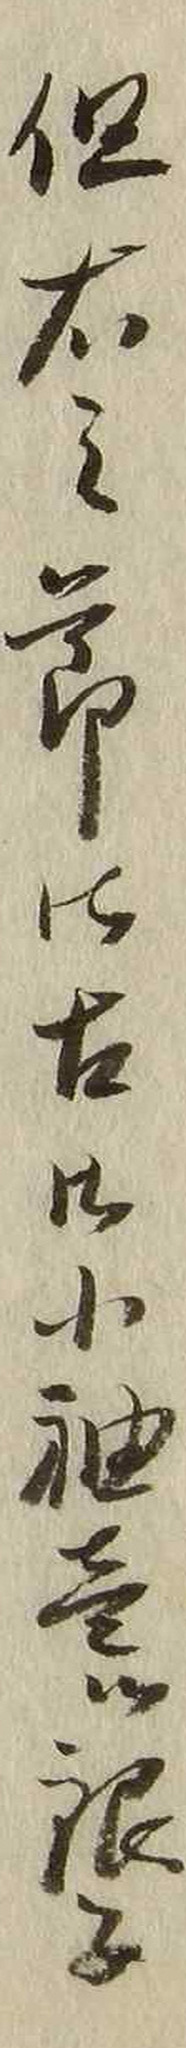但右之節御古御小袖壱ツ銀子
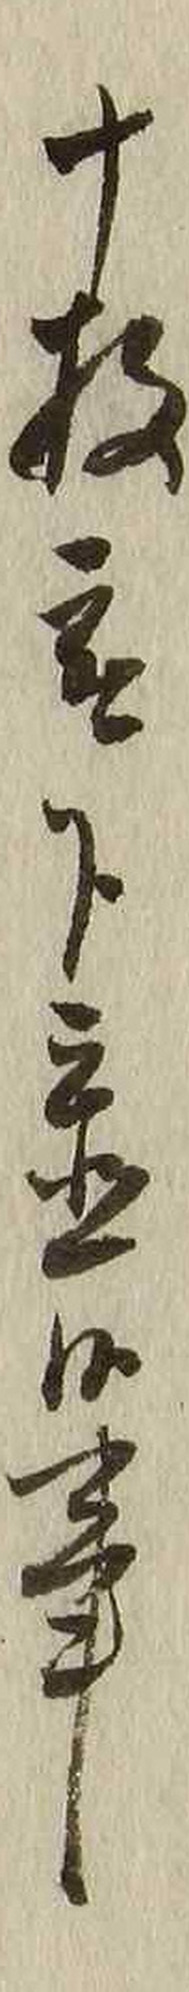十枚被下置候事
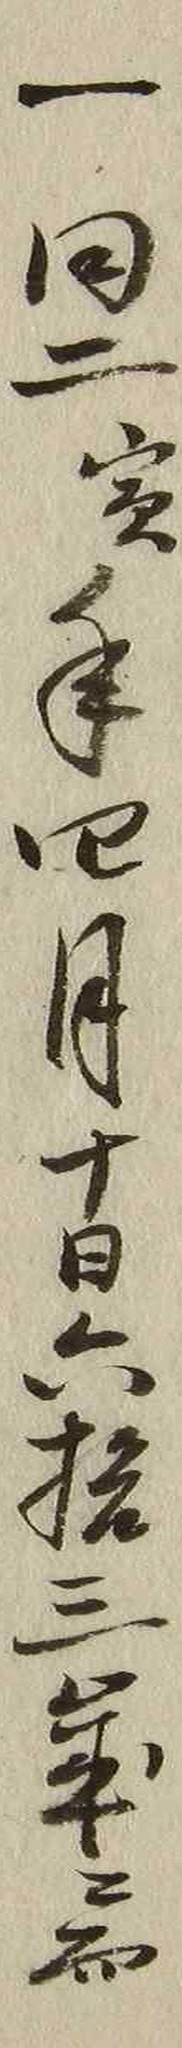一同二寅年四月十日六拾三歳ニ而
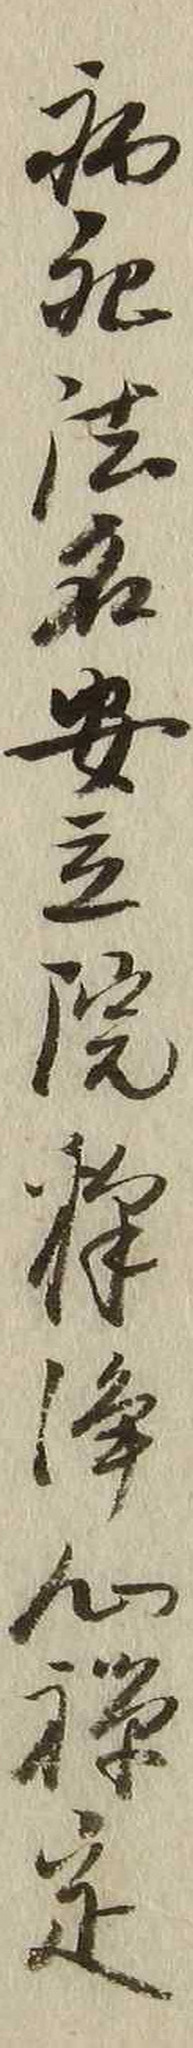病死法名安立院釈浄心禅定
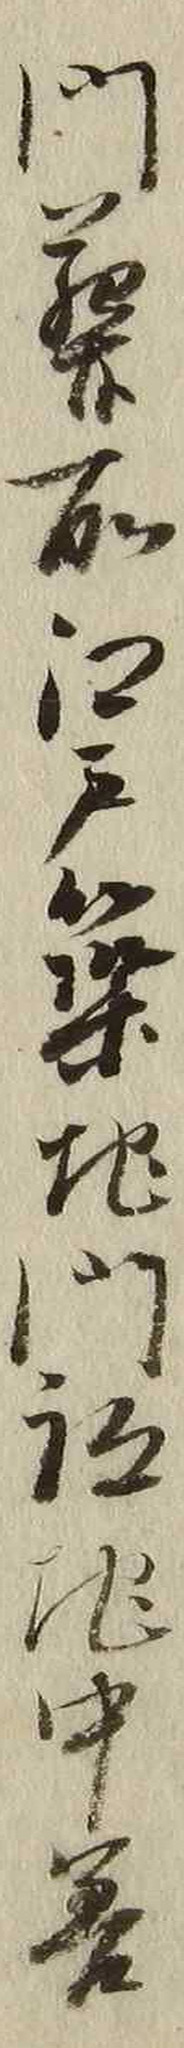門葬所江戸築地門跡地中善
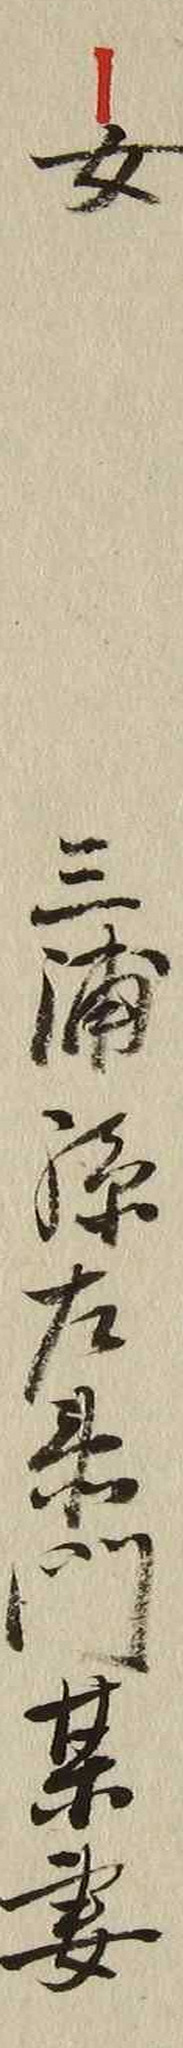女三浦孫左衛門某妻
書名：諸士系譜　巻之355　す之部5
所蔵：会津若松市立会津図書館
